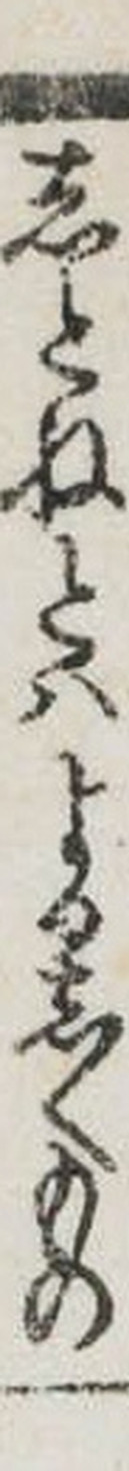しとねとはよるしくもの
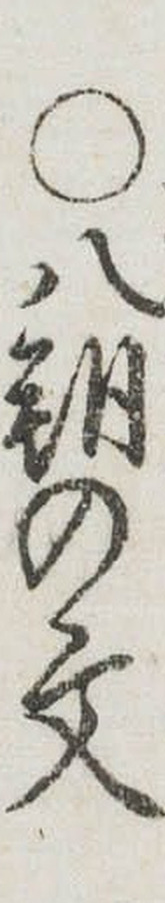○八朔の文
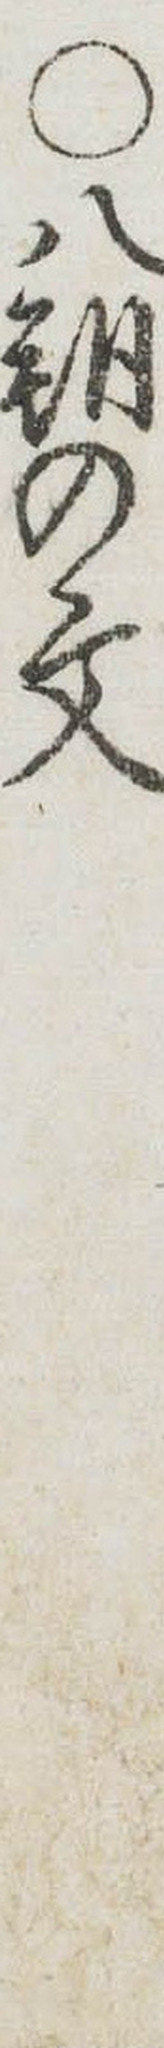○八朔の文
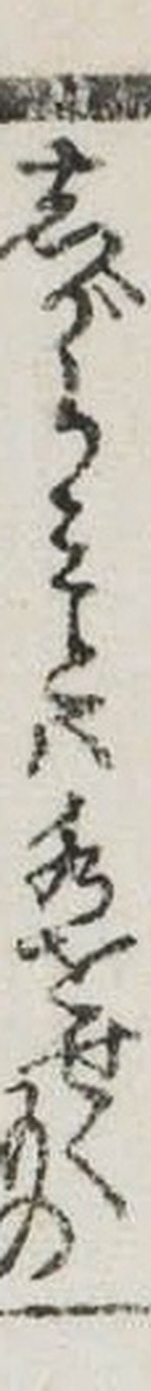しがらみとは水をせくもの
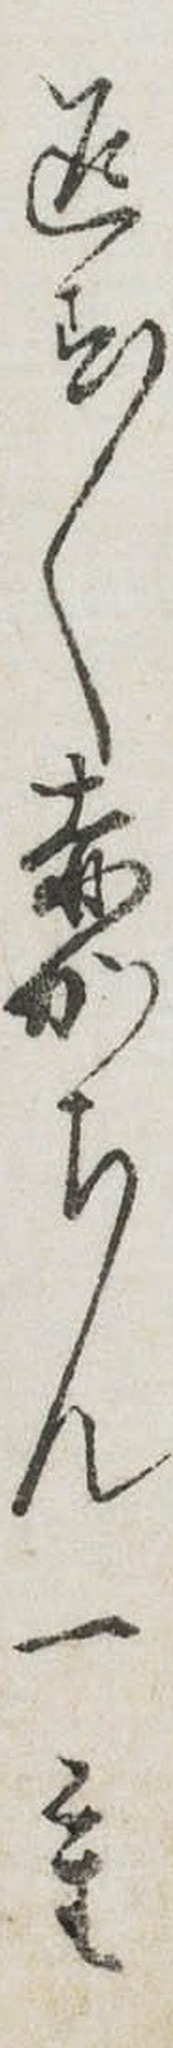返す〳〵赤かちん一重
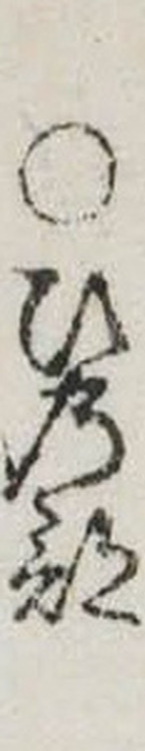○ひの部
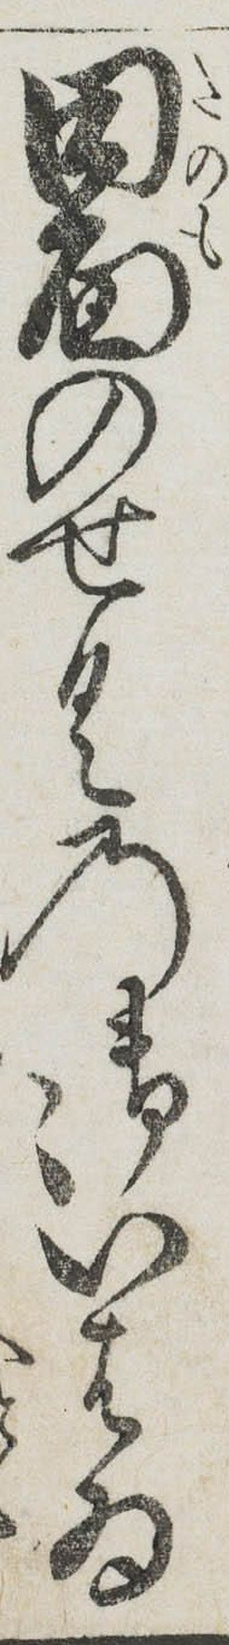田面のせくの御いはゐ
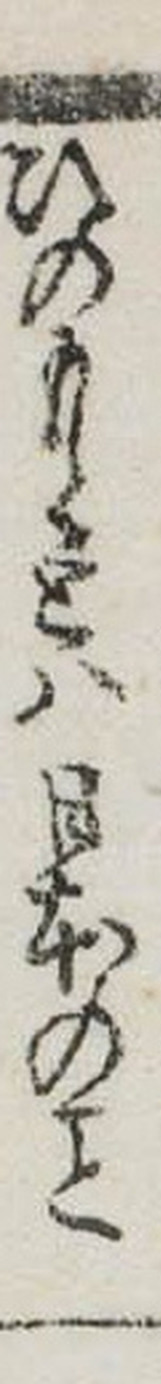ひのもととは日本のこと
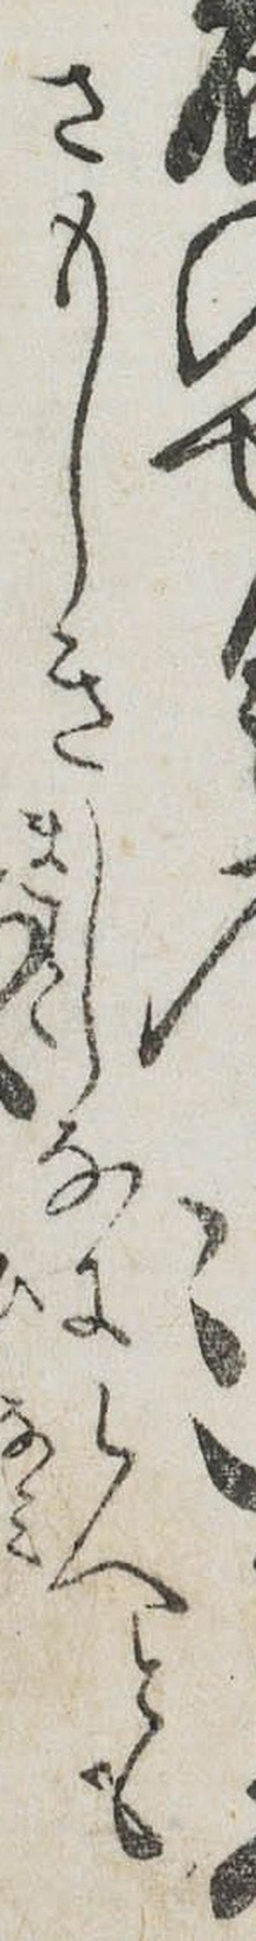さもしきしなに候へとも
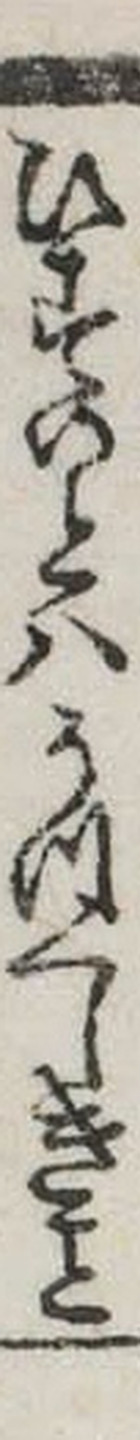ひすいとはうつくしきこと
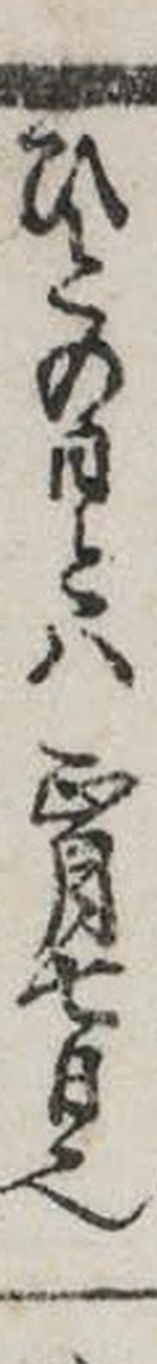ひとの日とは正月七日也
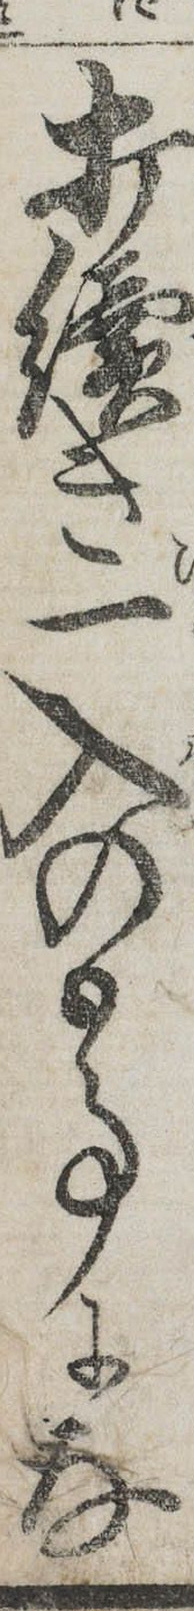打続き一入の御事に存
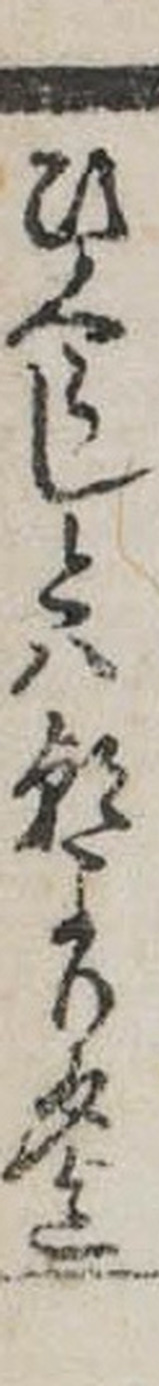ひくらしとは朝より夕迄

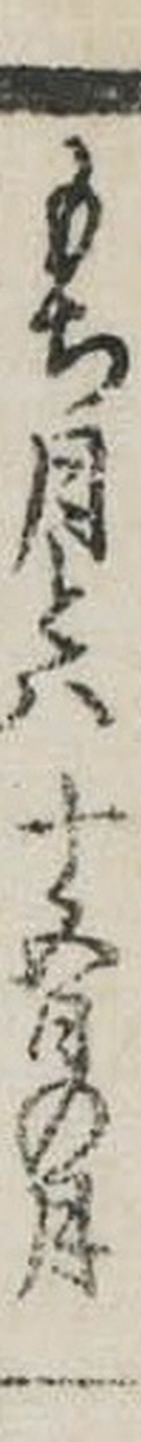もち月とは十五夜の月
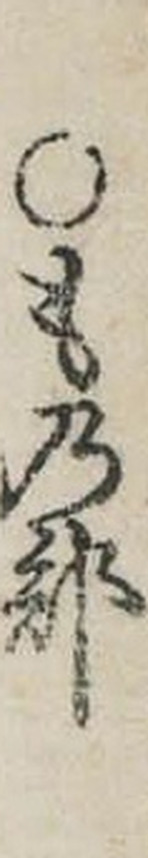○もの部
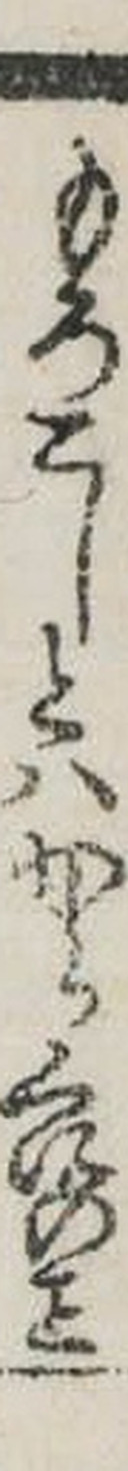もろこしとはからくにのこと
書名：頭書萬用婦人手紙之文言
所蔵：東京学芸大学教育コンテンツアーカイブ
